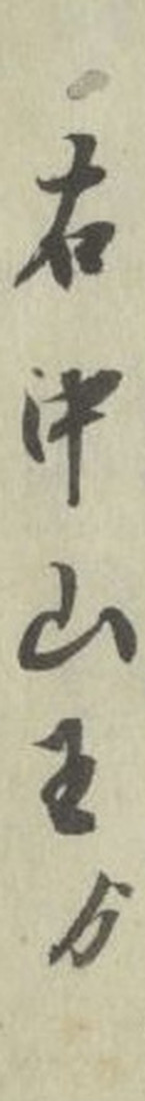右中山王ゟ
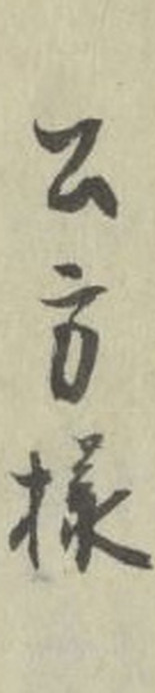公方様
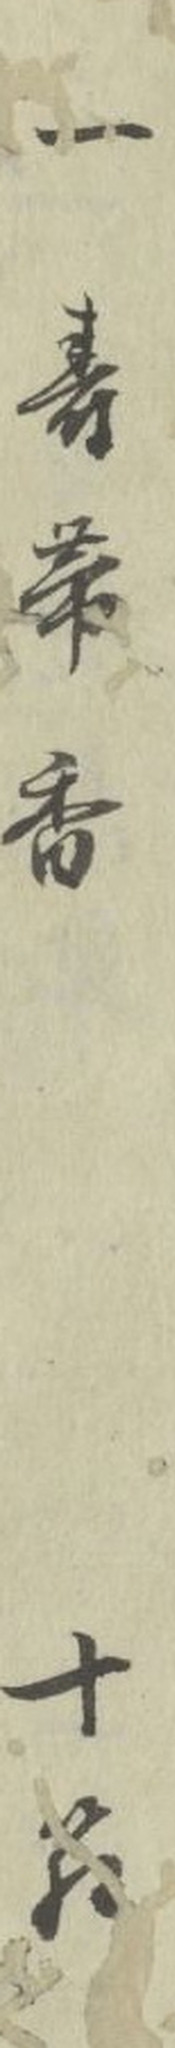一寿帯香十箱
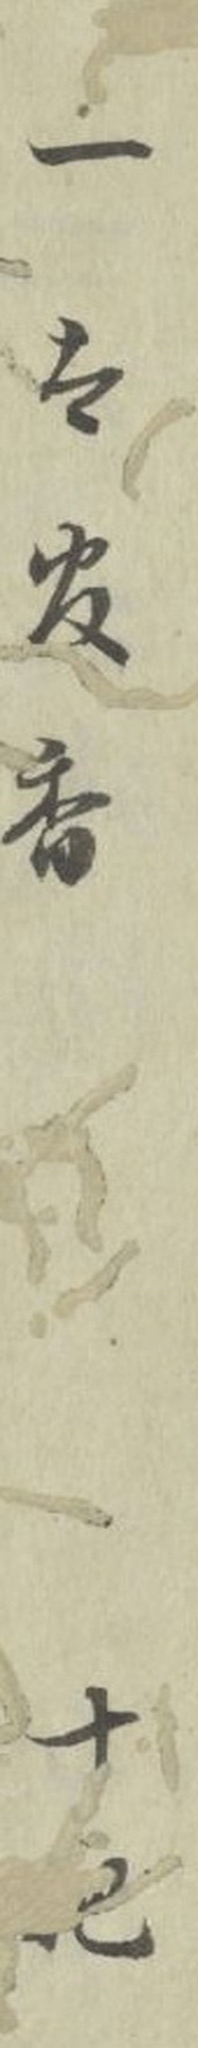一太官香十把
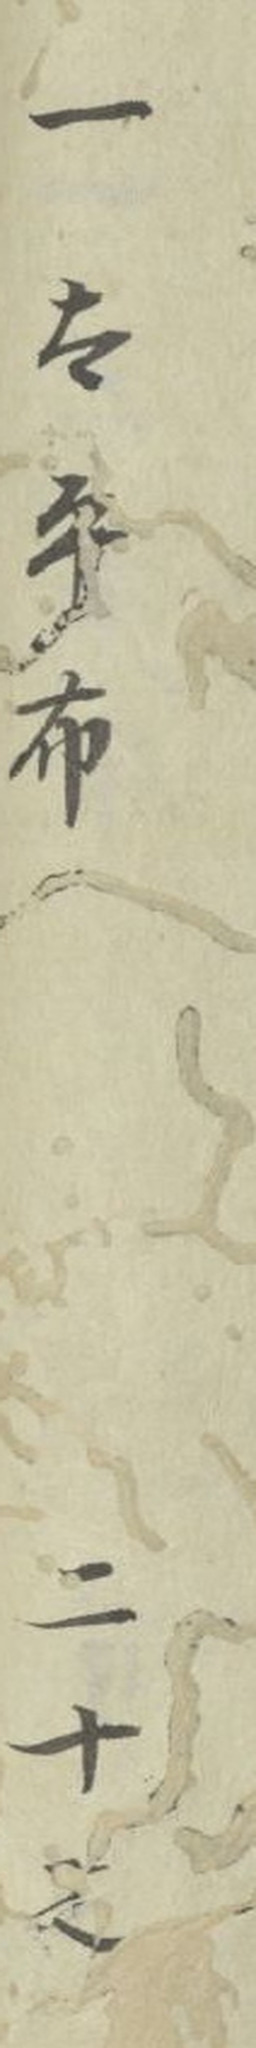一太平布二十疋
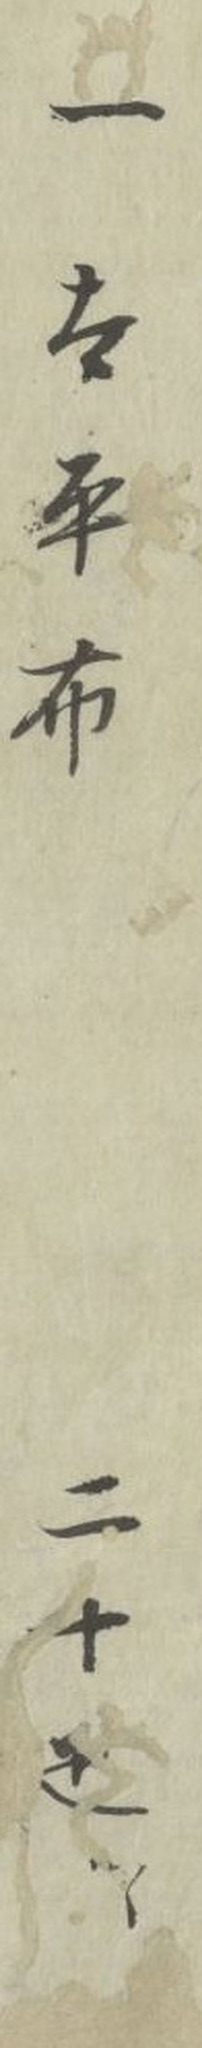一太平布二十疋ツヽ
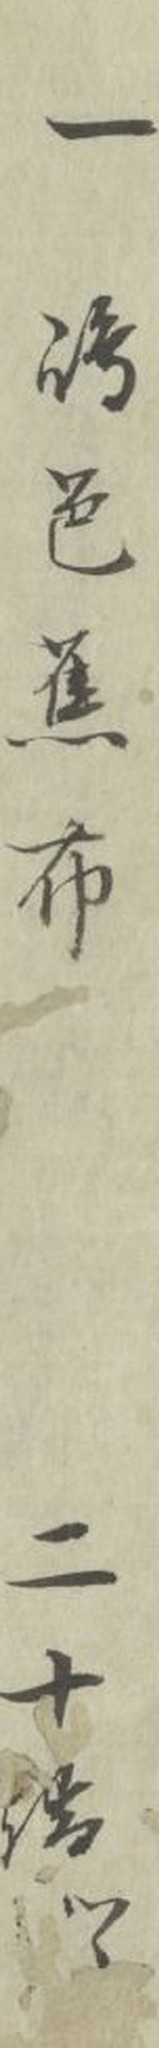一島芭蕉布二十端ツヽ
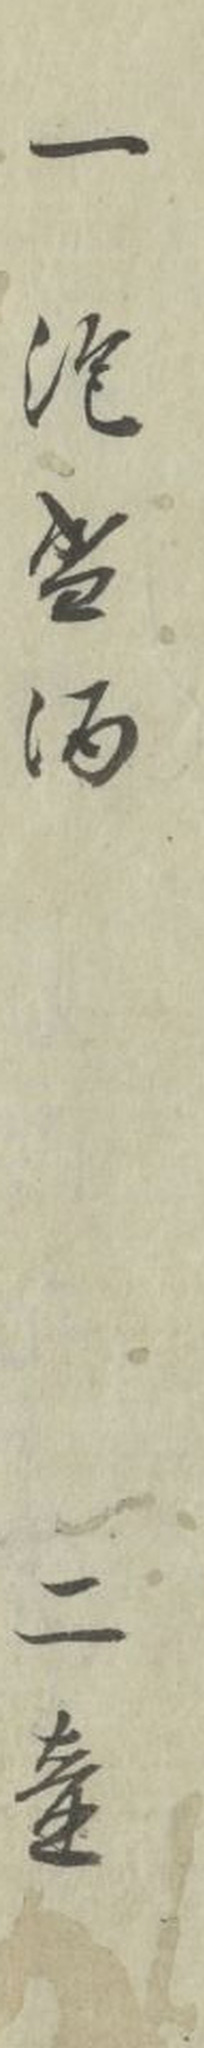一泡盛酒二壺
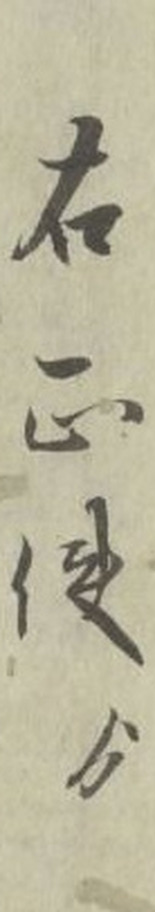右正使ゟ

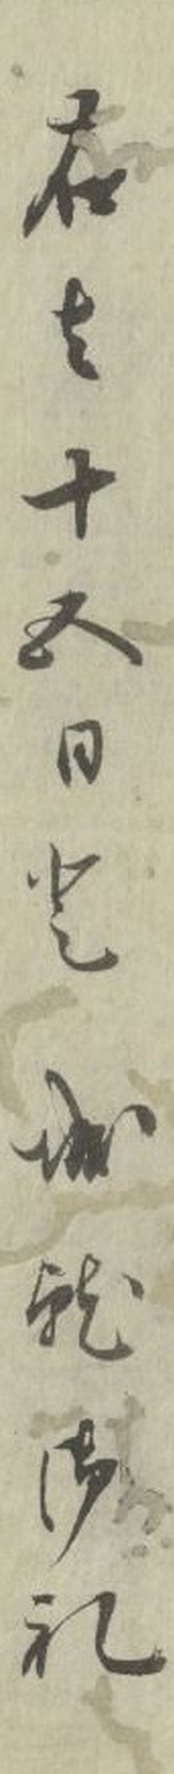右は十五日登城就御礼
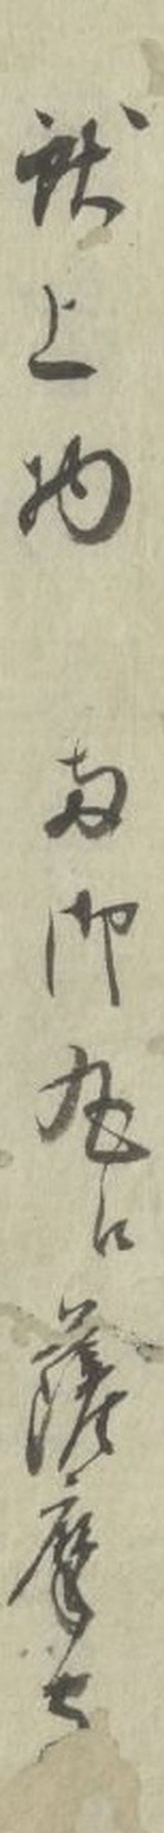献上物両御丸え薩摩守
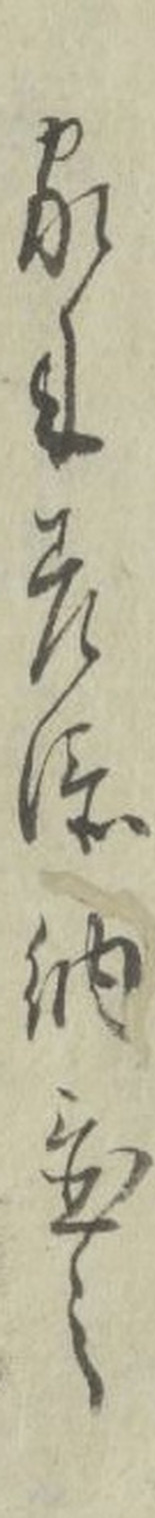家来差添納置之
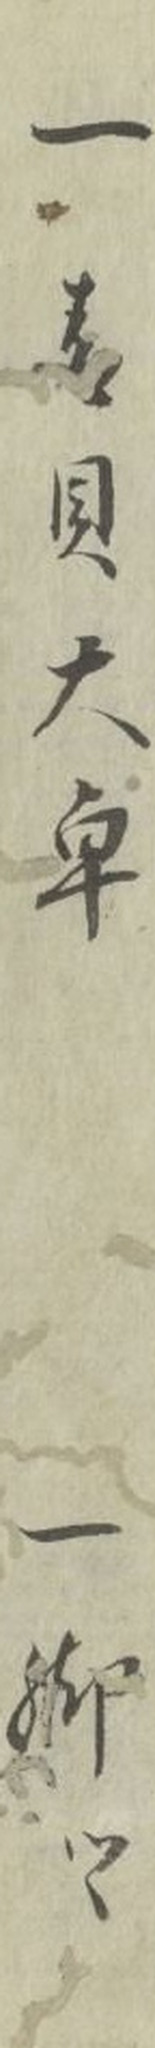一青貝大卓一脚ツヽ

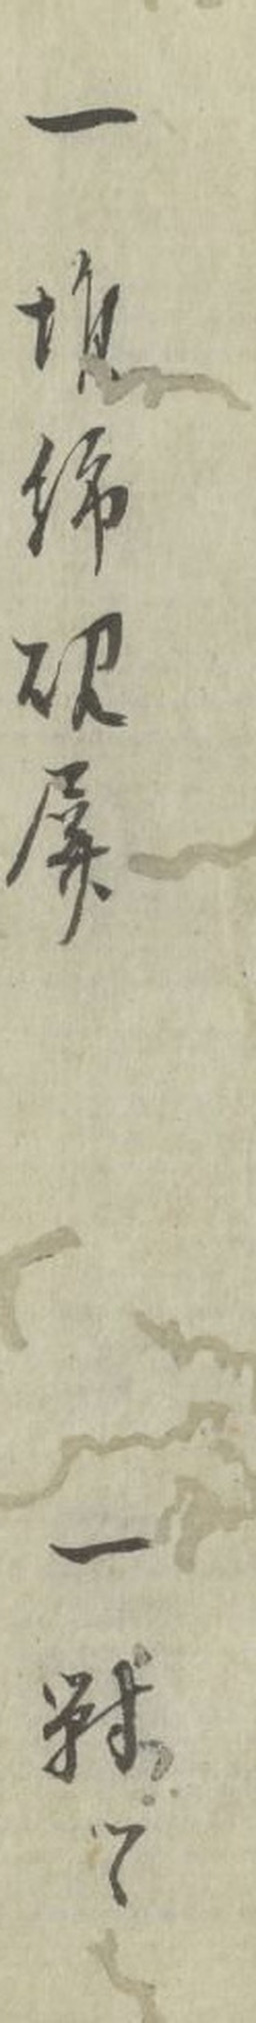一堆錦硯屏一対ツヽ
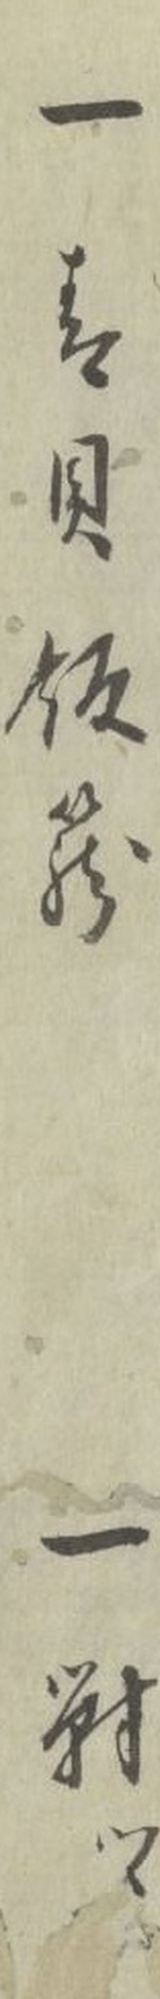一青貝飯籠一対ツヽ
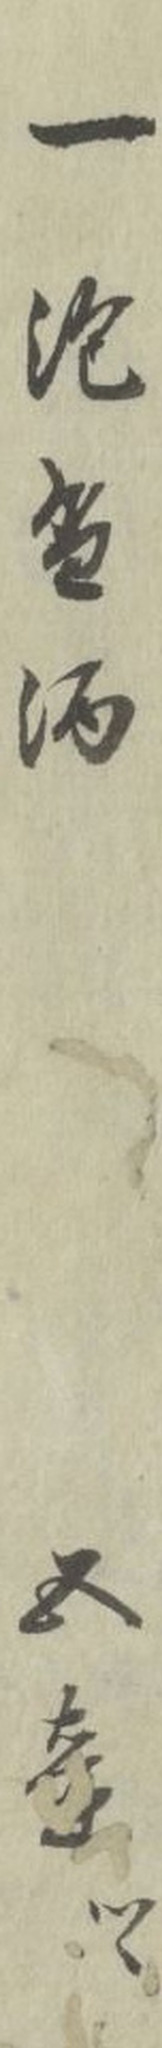一泡盛酒五壺ツヽ
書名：琉球来朝記 自八至十四終
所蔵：University of the Ryukyus Library
